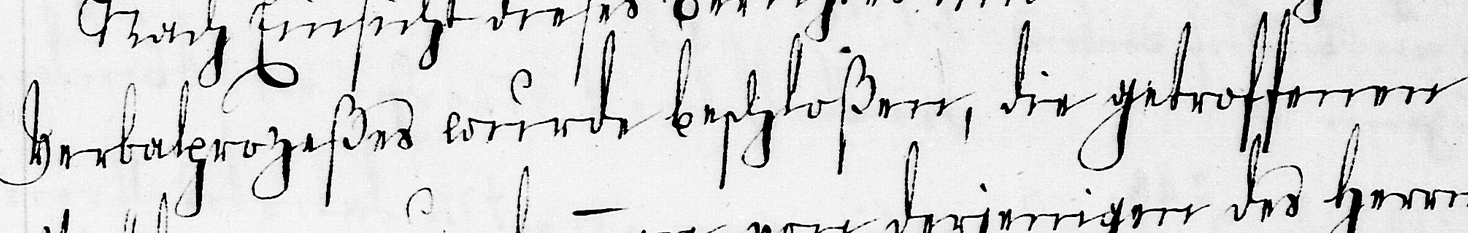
Verbalprozeßes wurde beschloßen, die getroffenen
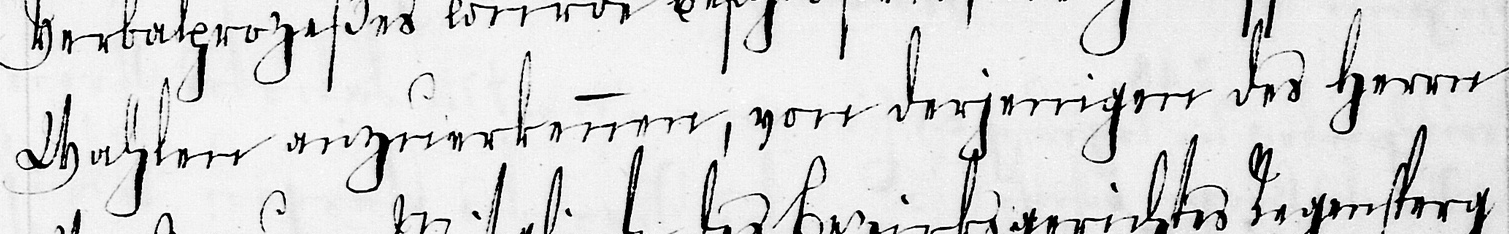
Wahlen anzuerkennen, von derjenigen des Herrn
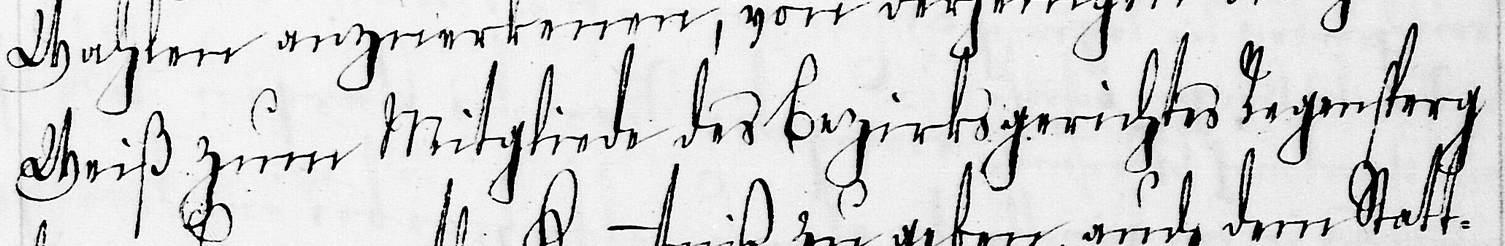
Weiß zum Mitgliede des Bezirksgerichtes Regensperg
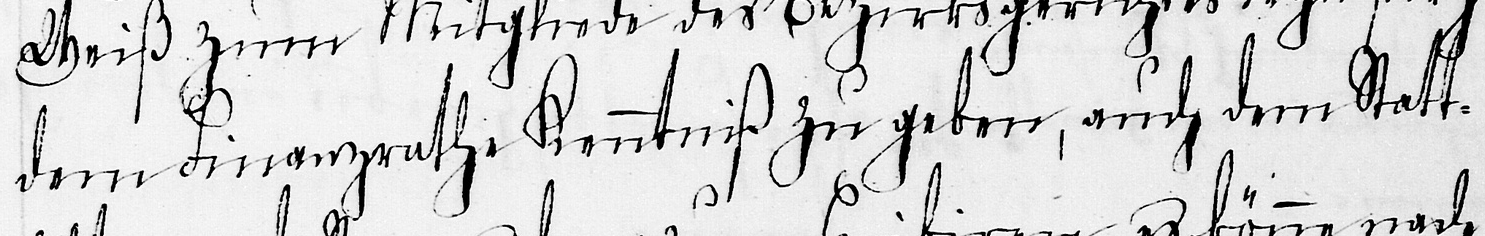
dem Finanzrathe Kenntniß zu geben, auch dem Statt¬
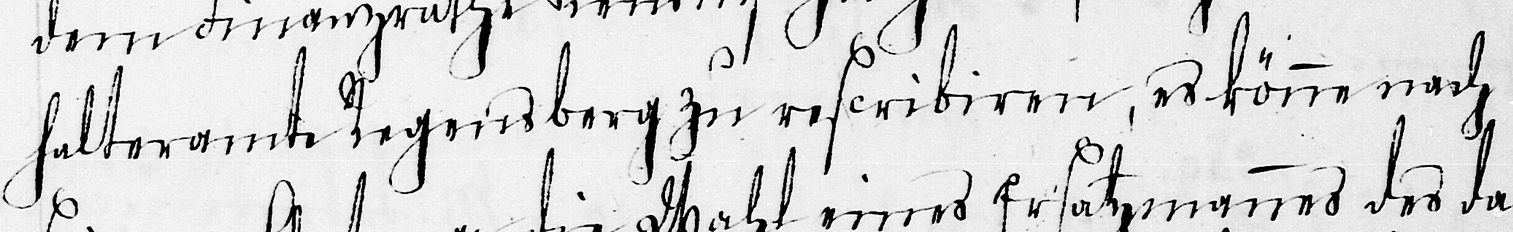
halteramte Regensperg zu rescribiren, es könne nach
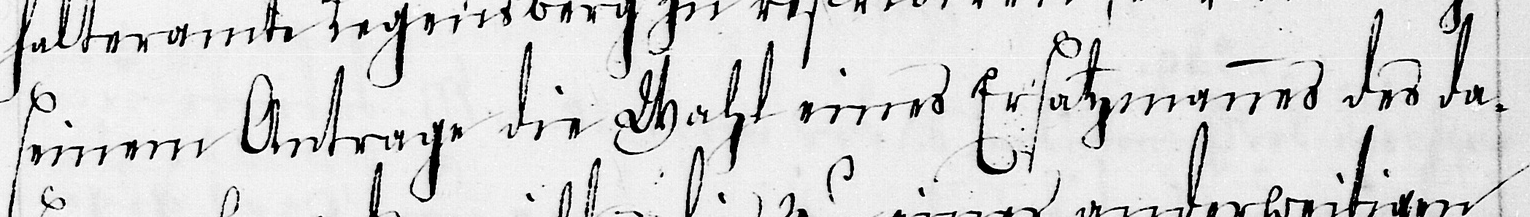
seinem Antrage die Wahl eines Ersatzmannes des da¬
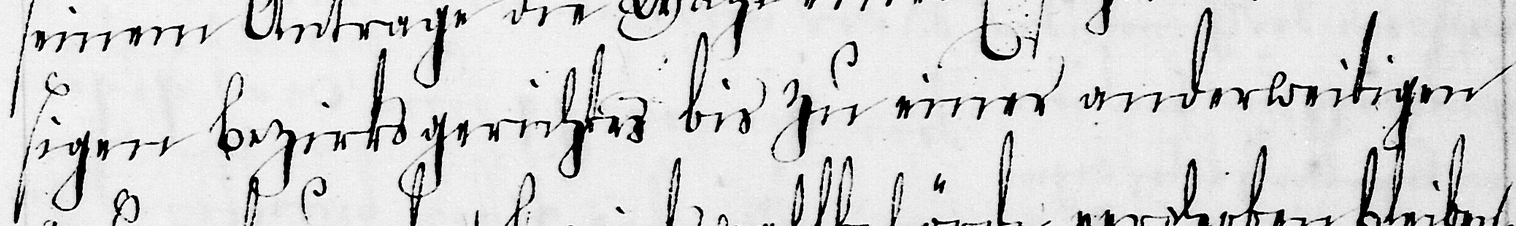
sigen Bezirksgerichtes bis zu einer anderweitigen
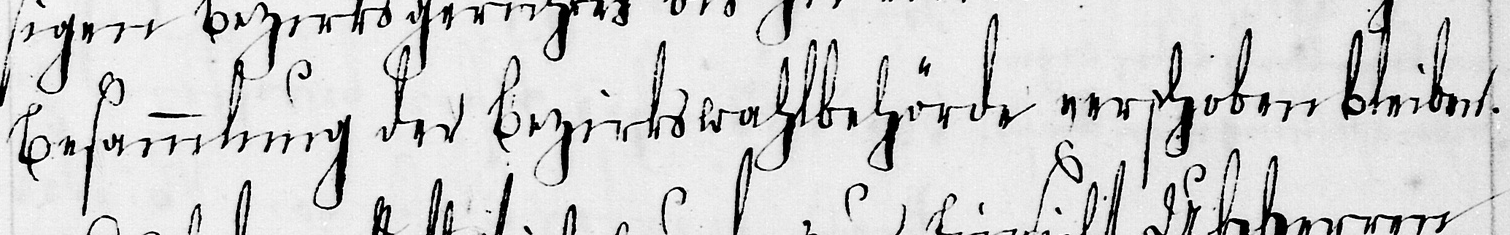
Besammlung der Bezirkswahlbehörde verschoben bleiben.
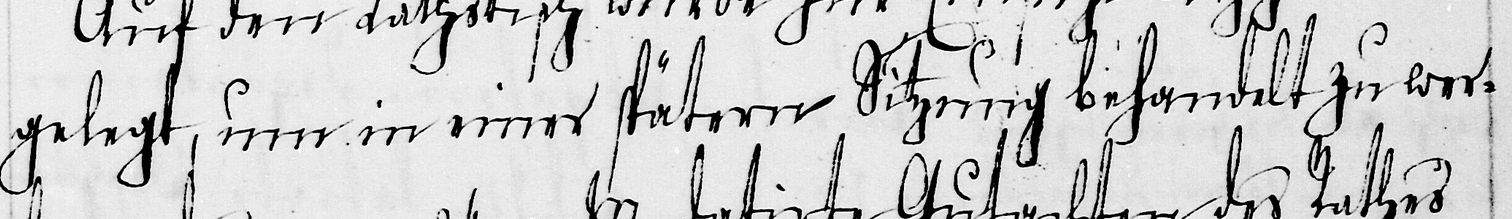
gelegt, um in einer spätern Sitzung behandelt zu wer¬
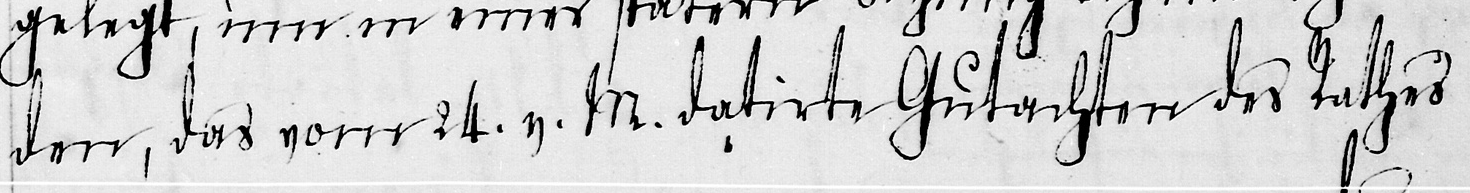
den, das vom 24. v. M. datire Gutachten des Rathes
